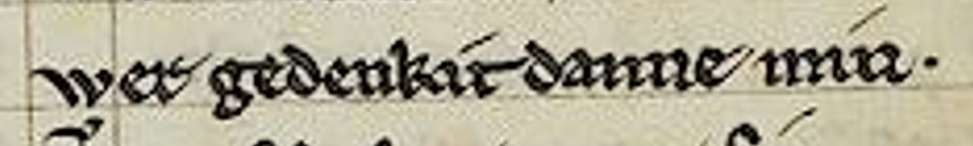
Wer gedenkit danne min.
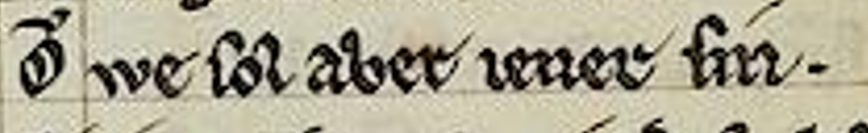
O°vwe ſol aber iener ſin.
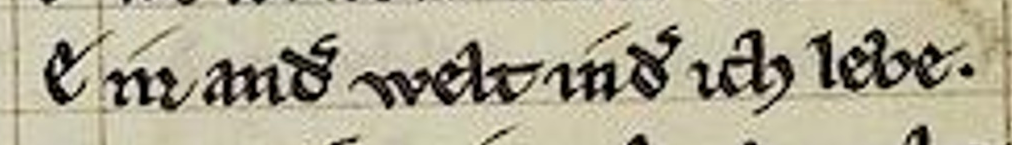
Ein and(er) welt in d(er) ich lebe.
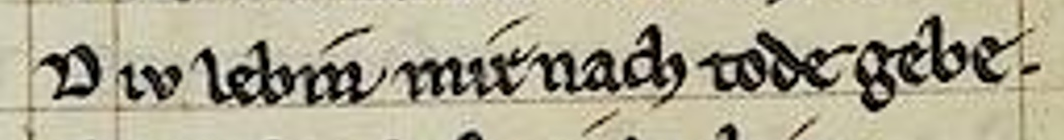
Div lebin mir nach tode gebe.
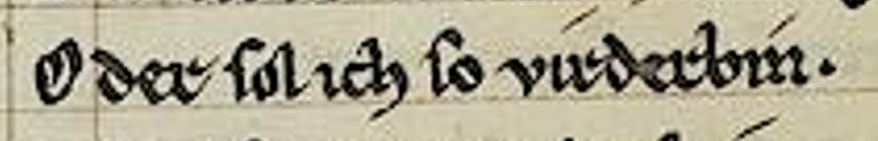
Oder ſol ich ſo virderbin.
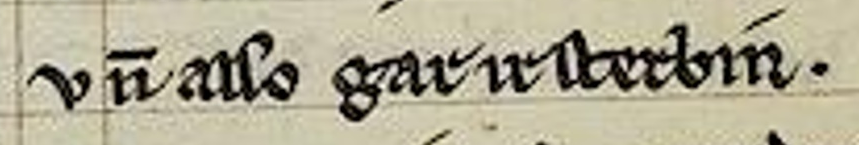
Vn(d) alſo gar ir ſterbin.
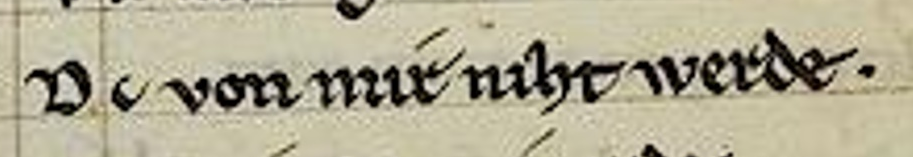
D(az) von mir niht werde.
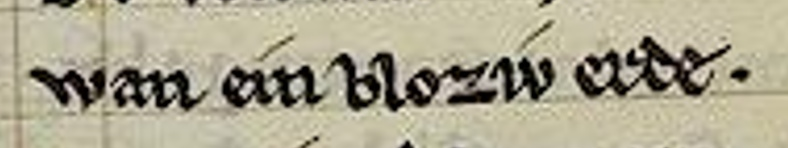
Wan ein bloziv erde.
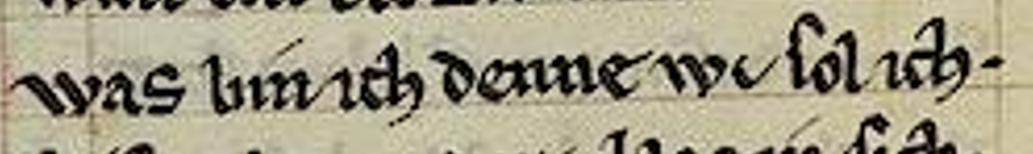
Was bin ich denne w(az) ſol ich.
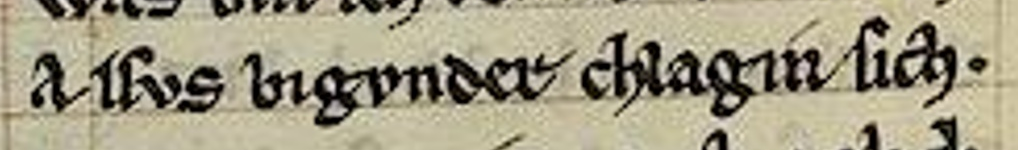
Alſvs bigvnder chlagin ſich.
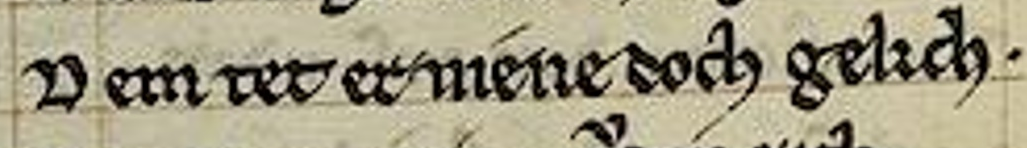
Dem tet er niene doch gelich.
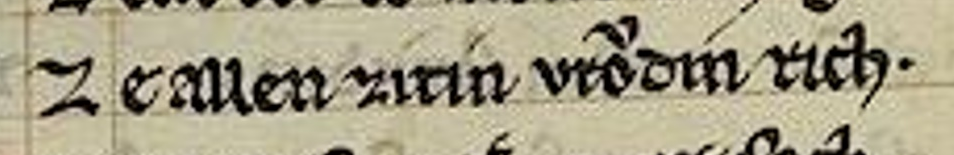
Ze allen zitin vro°din rich.
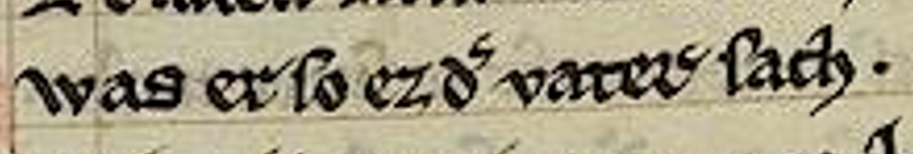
Was er ſo ez d(er) vater ſach.
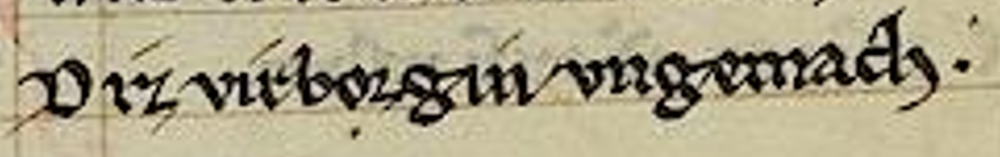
Diz virborgin vngemach.
